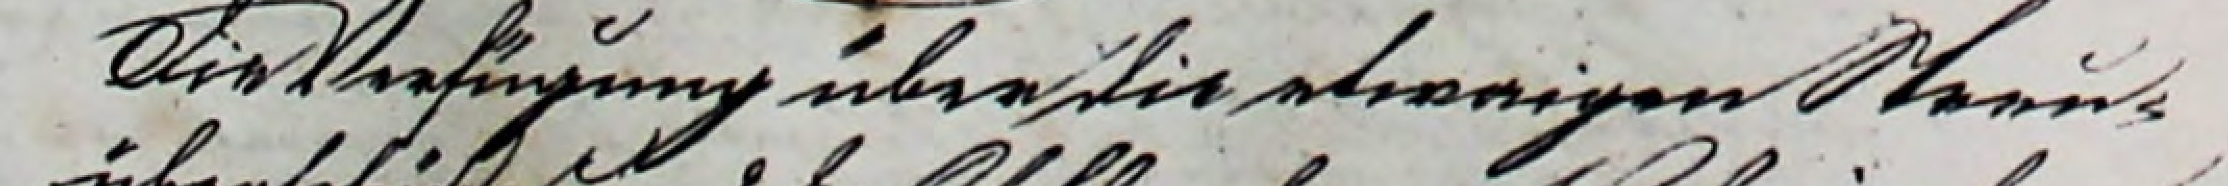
Die Verfügung über die etwaigen Streu„
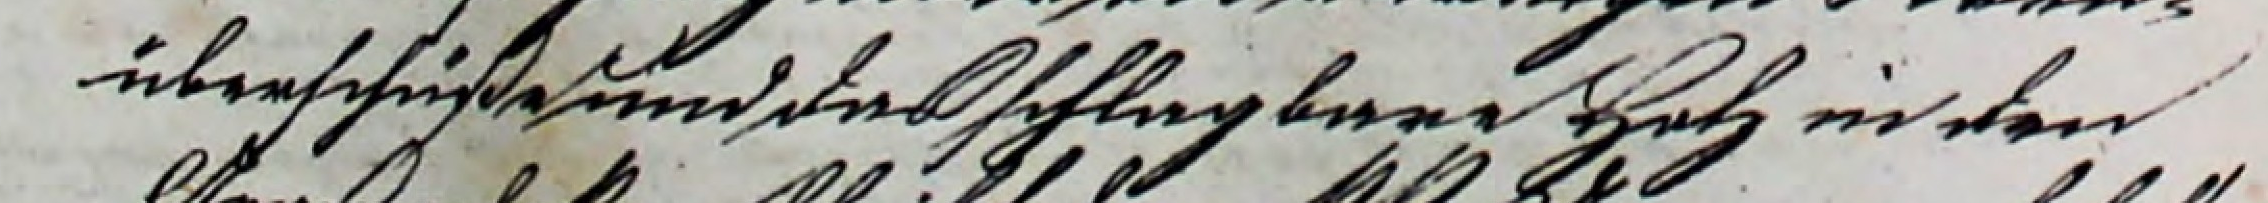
überschüße und das schlagbare Holz in den
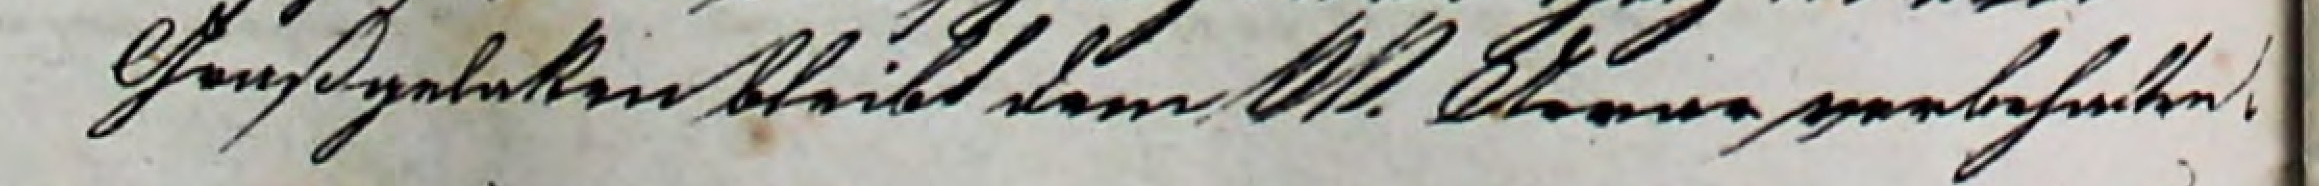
Graßgelaken bleibt dem kk. Aerar verbeh???
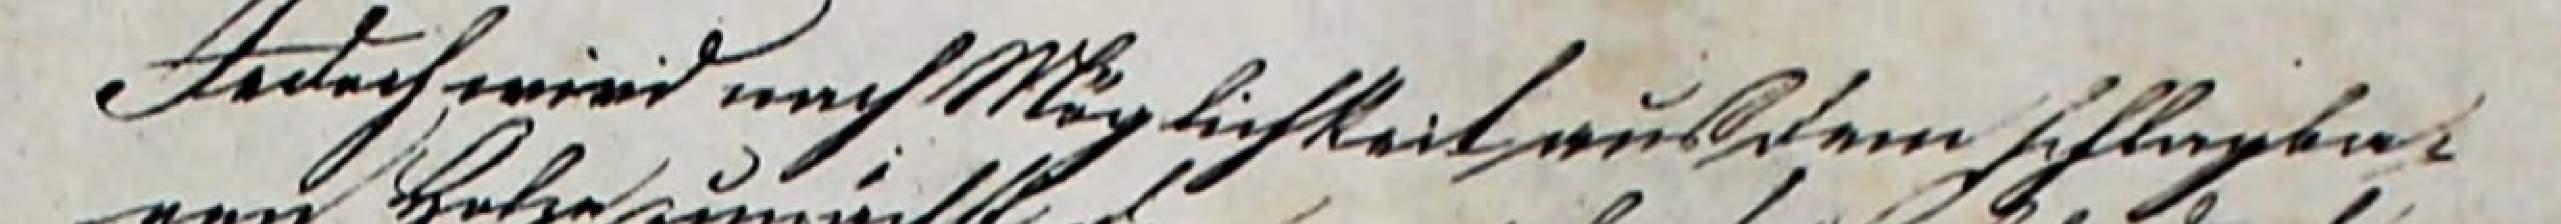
Jedoch wird nach Möglichkeit aus dem schlagba„
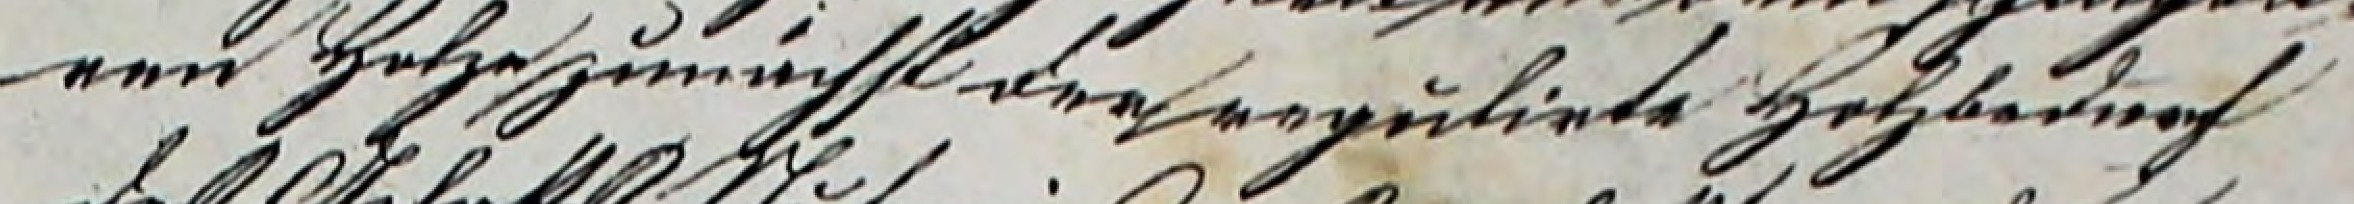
ren Holze zunächst der regulirte Holyzbedarf
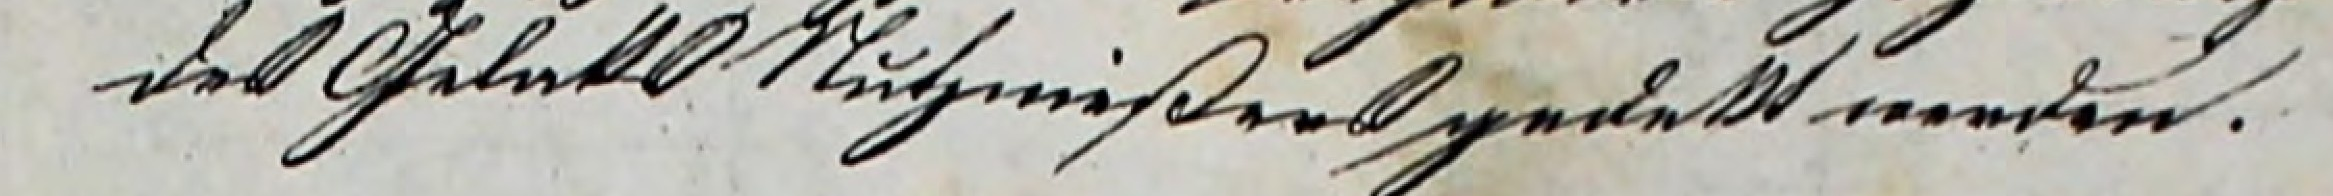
des Gelaks Nutzmeßers gedekt werde.
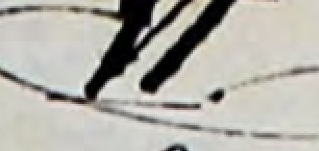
VI.
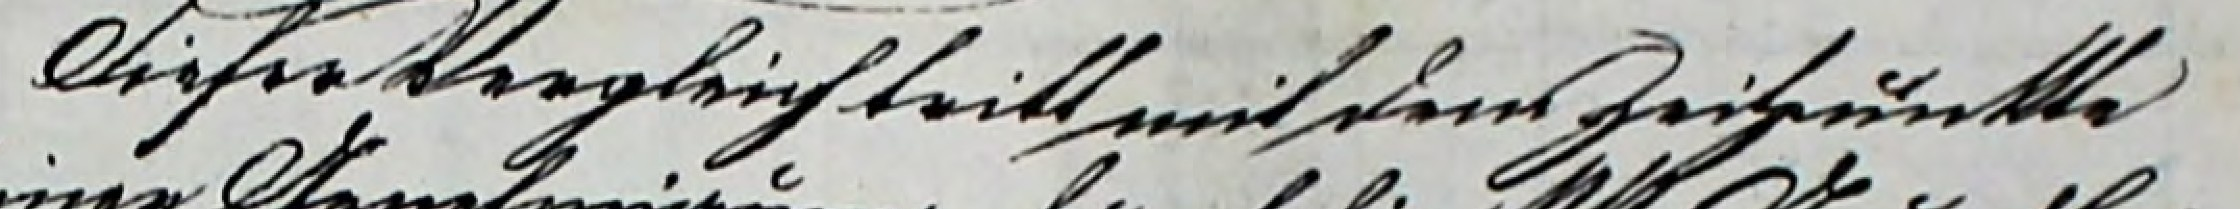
Dieser Vergleich tritt mit dem Zeitpunkte
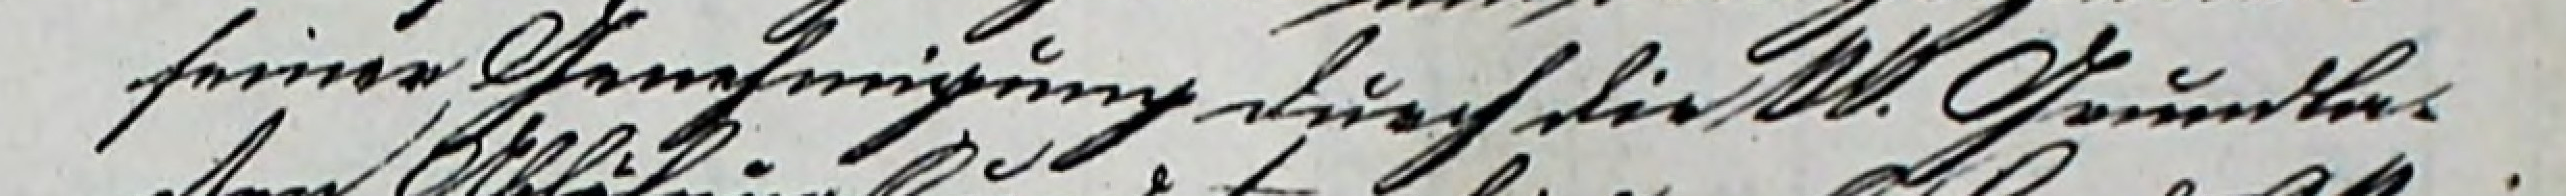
seiner Genehmigung durch die kk. Grundla„
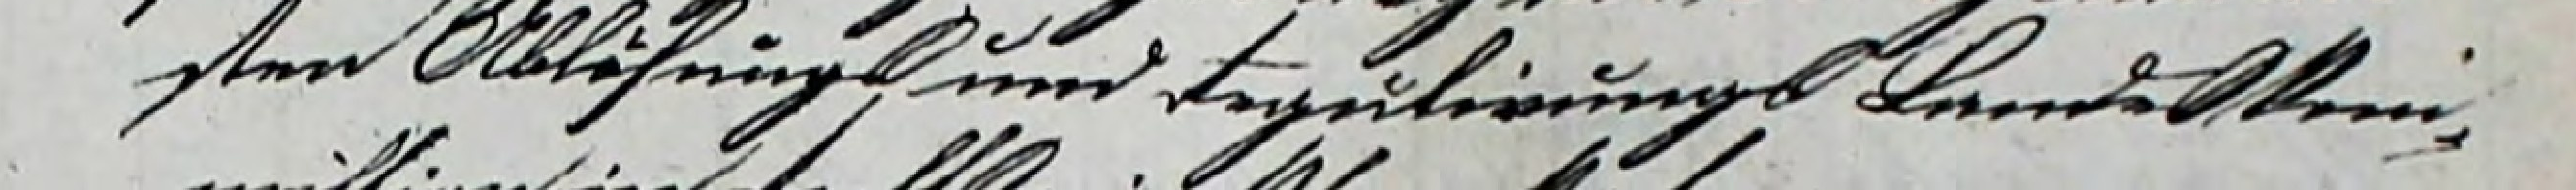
sten Ablößungs und Regulirungs Landeskom„
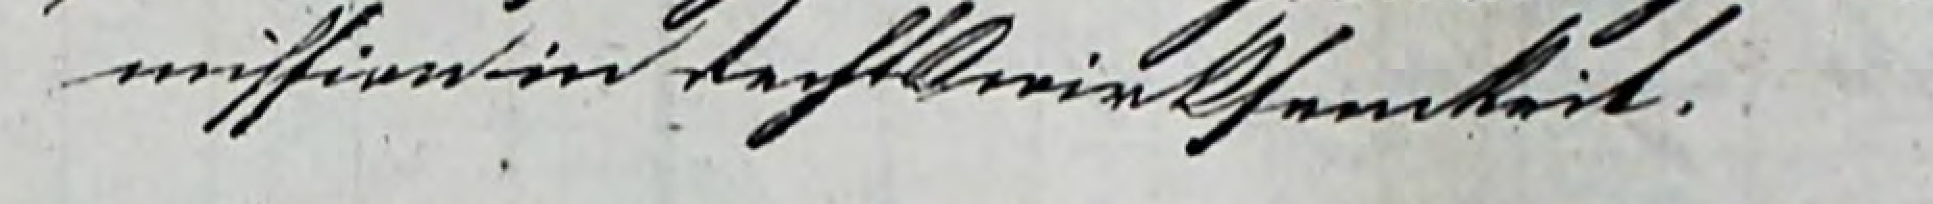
mission in Rechtswirksamkeit.
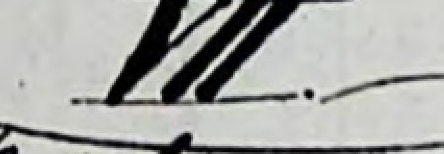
VII.
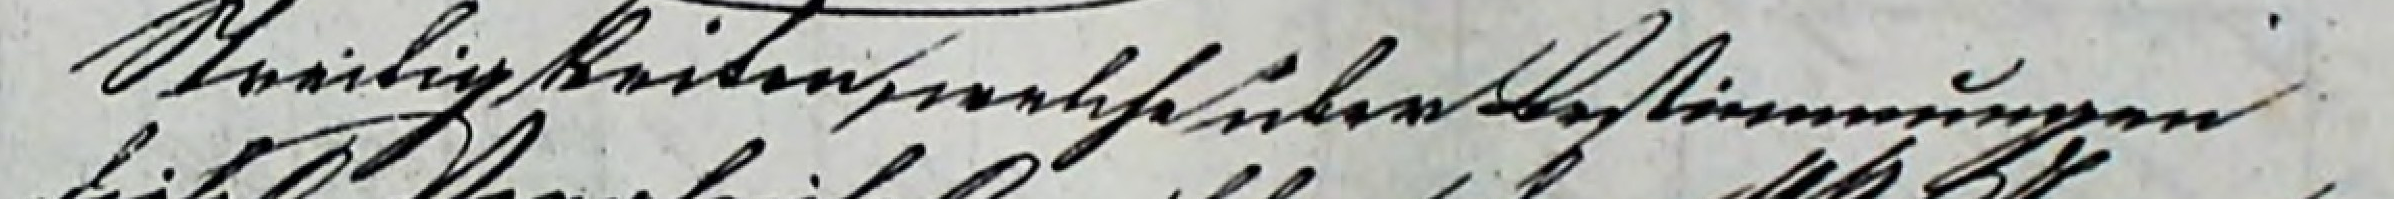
Streitigkeiten, welche über Bestimmungen
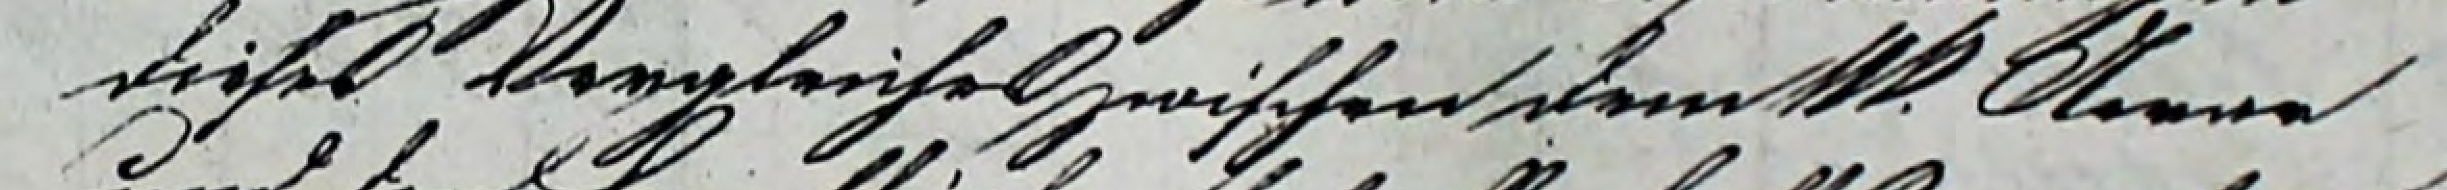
dieses Vergleiches zwischen dem kk. Aerar
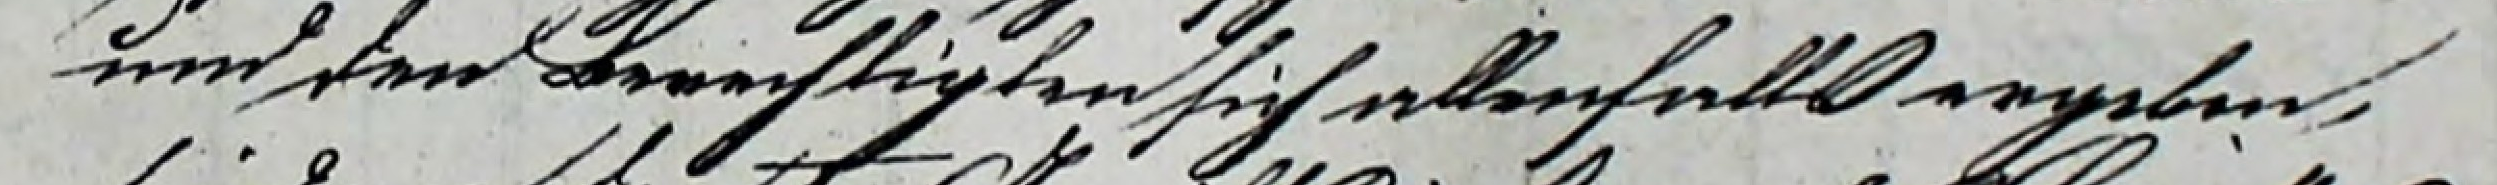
und den Berechtigten sich allenfalls ergeben,
